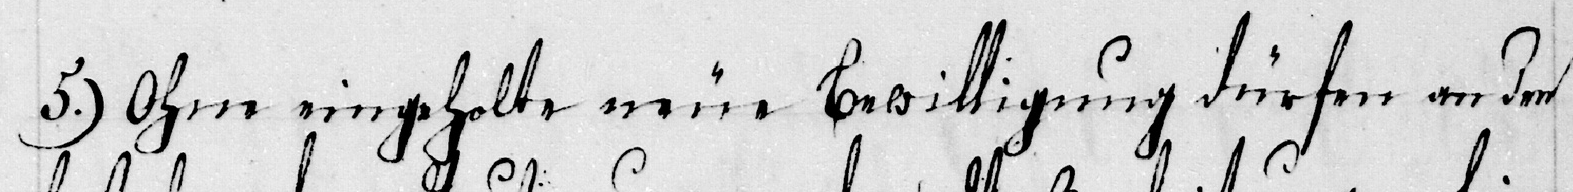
5.) Ohne eingeholte neue Bewilligung dürfen an den
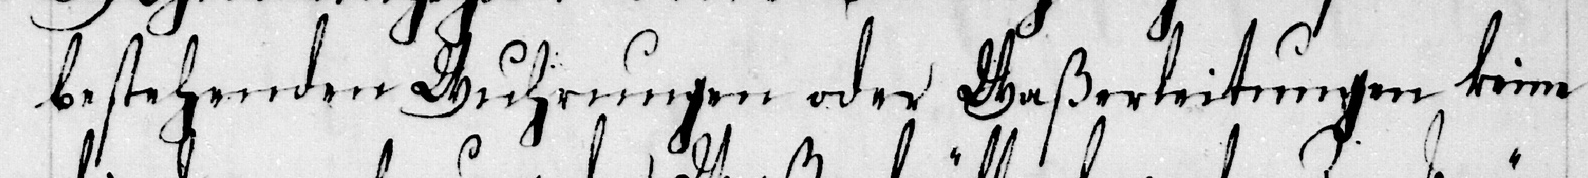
bestehenden Wuhrungen oder Waßerleitungen keine
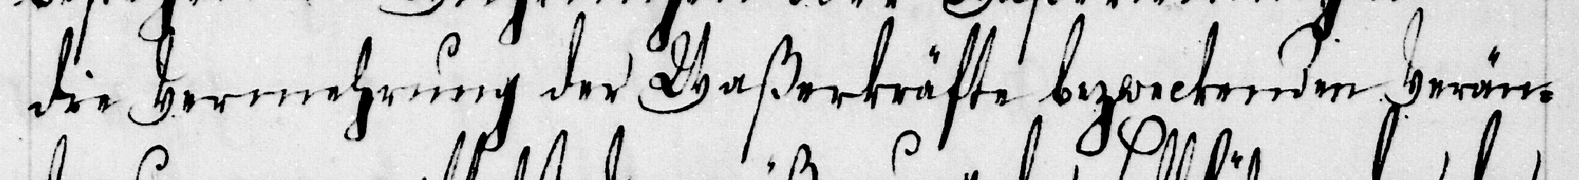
die Vermehrung der Waßerkräfte bezweckenden Verän¬
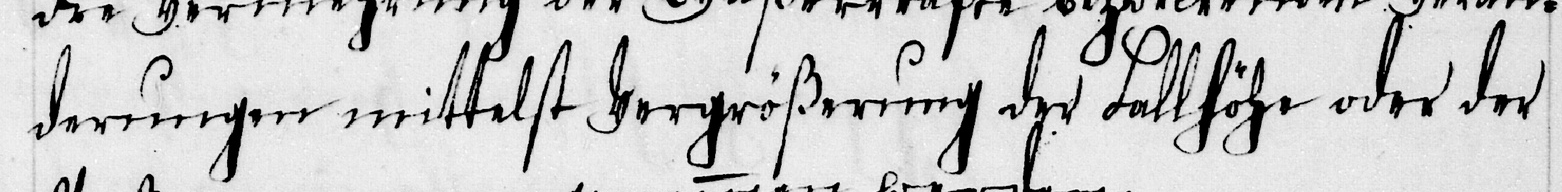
derungen mittelst Vergrößerung der Fallhöhe oder der
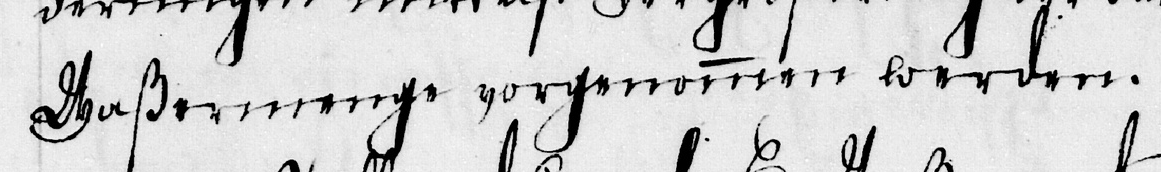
Waßermenge vorgenommen werden.
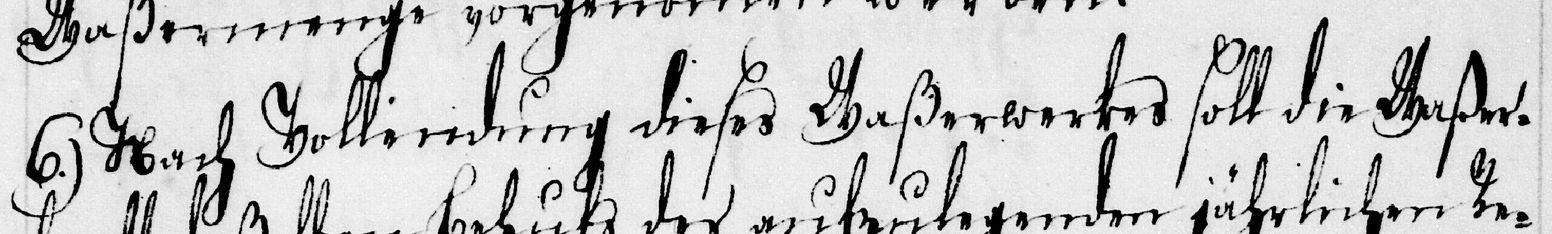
6.) Nach Vollendung dieses Waßerwerkes soll die Waßer¬
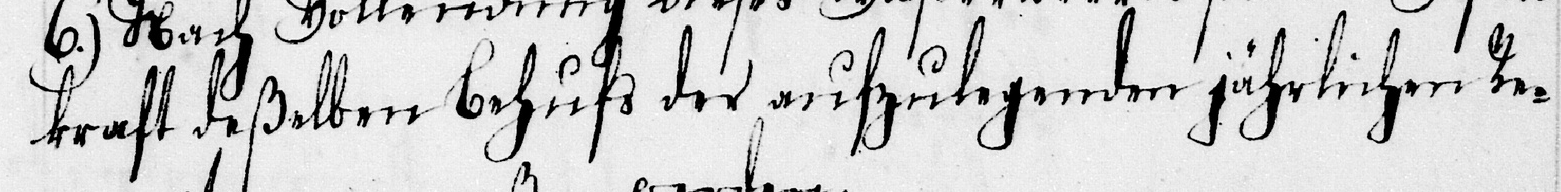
kraft deßelben Behufs der aufzulegenden jährlichen Re¬
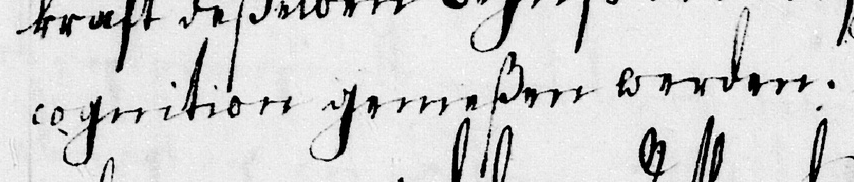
cognition gemeßen werden.
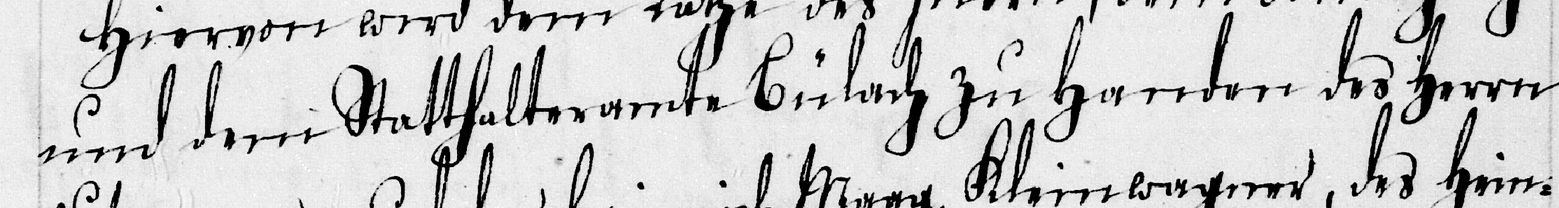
und dem Statthalteramte Bülach zu Handen des Herrn
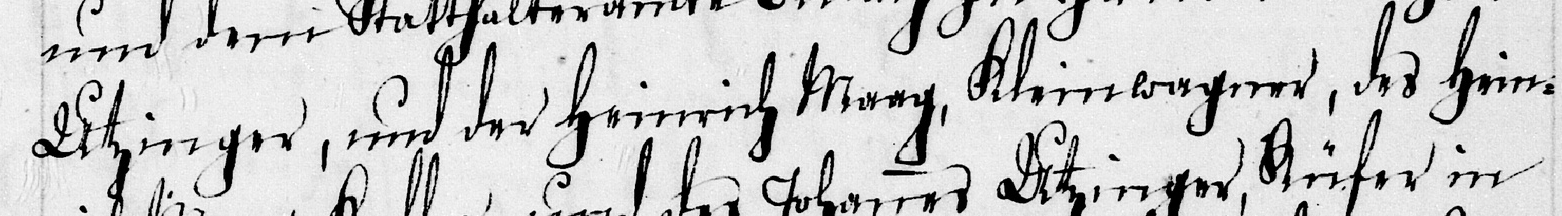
Utzinger, und der Heinrich Maag, Kleinwagner, des Hein¬
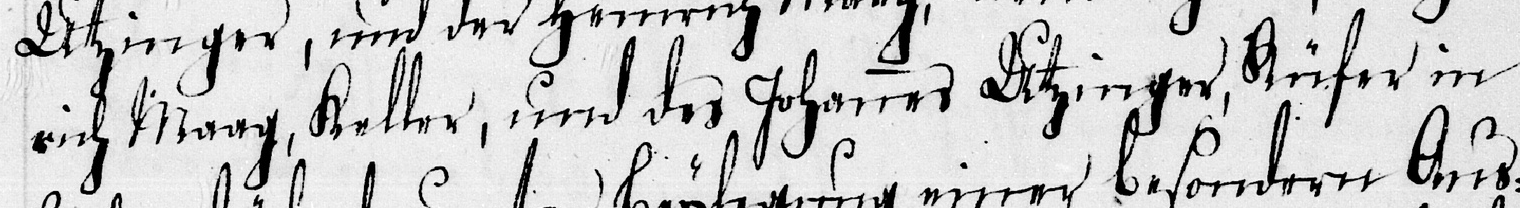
rich Maag, Keller, und des Johannes Utzinger, Küfer in
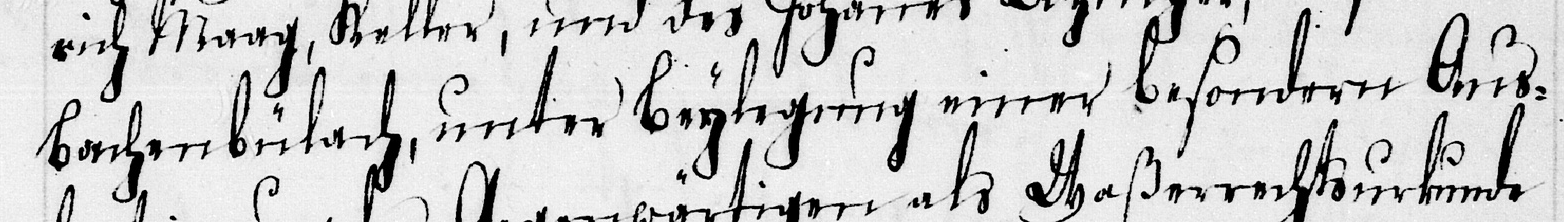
Bachenbülach, unter Beylegung einer besondern Aus¬
